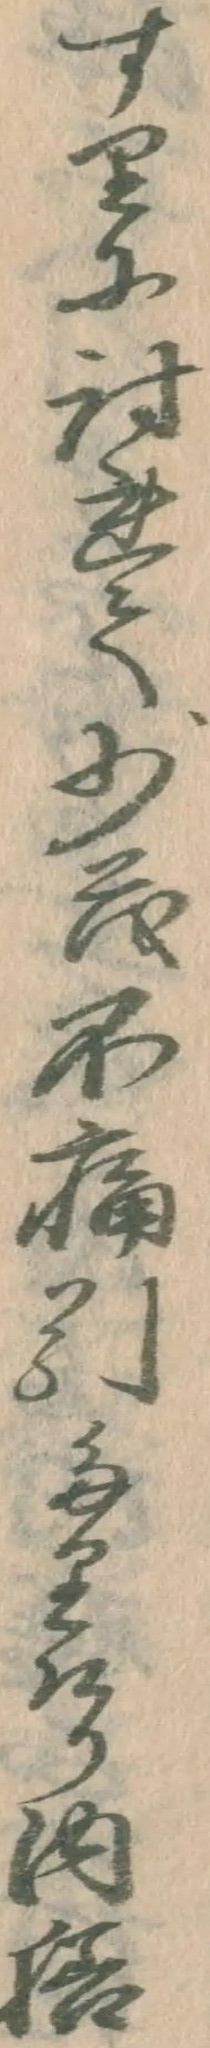す里尓討連て少茂不痛引多里けり内膳
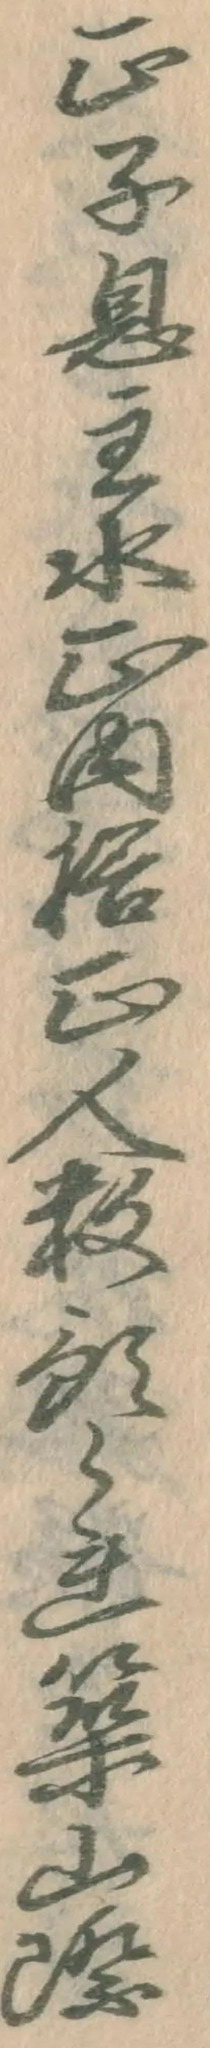正子息主水正内膳正人数預ら連築山際

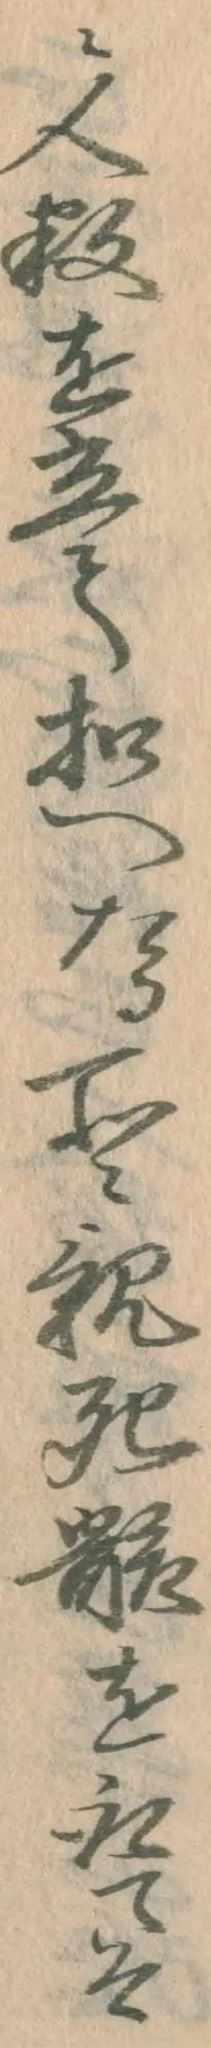に人数を立て扣へたる所に親死骸を取て今
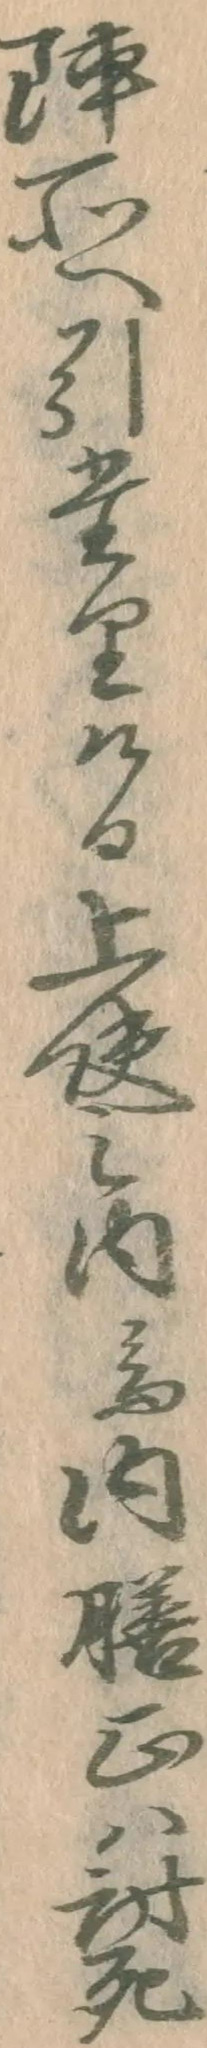陣所へ引堂里ける上使之内に而内膳正は討死
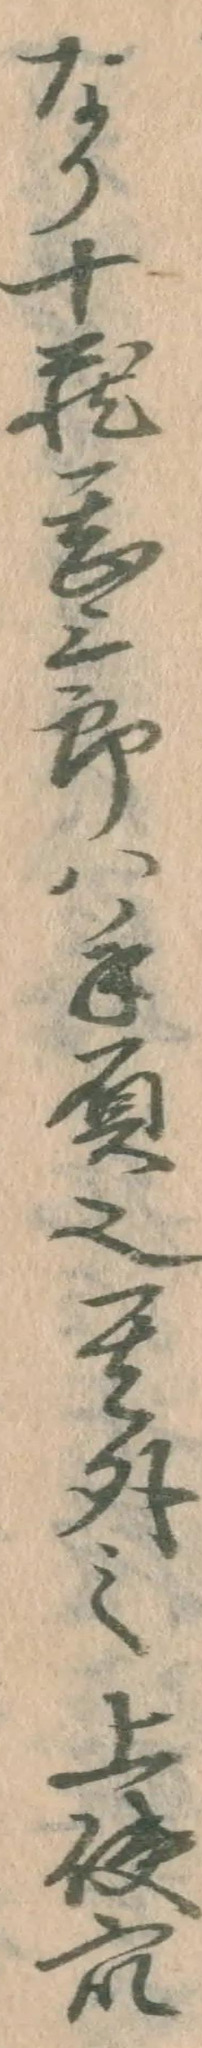なり十蔵甚三郎は手負也其外之上使衆
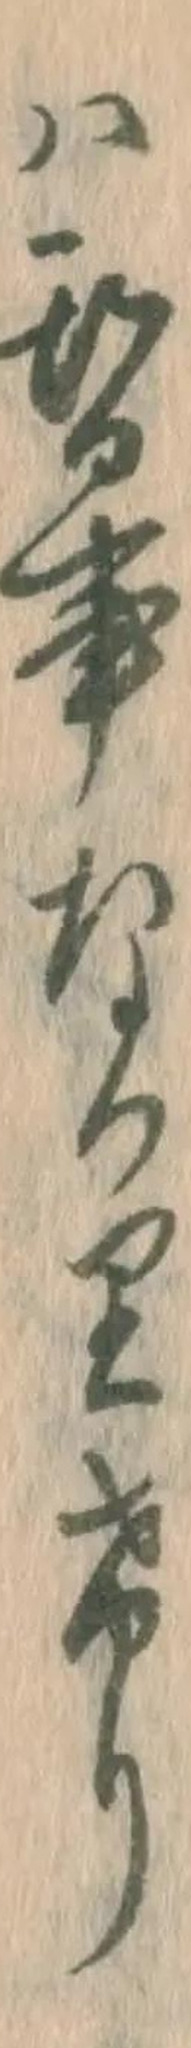は替事なか里希り
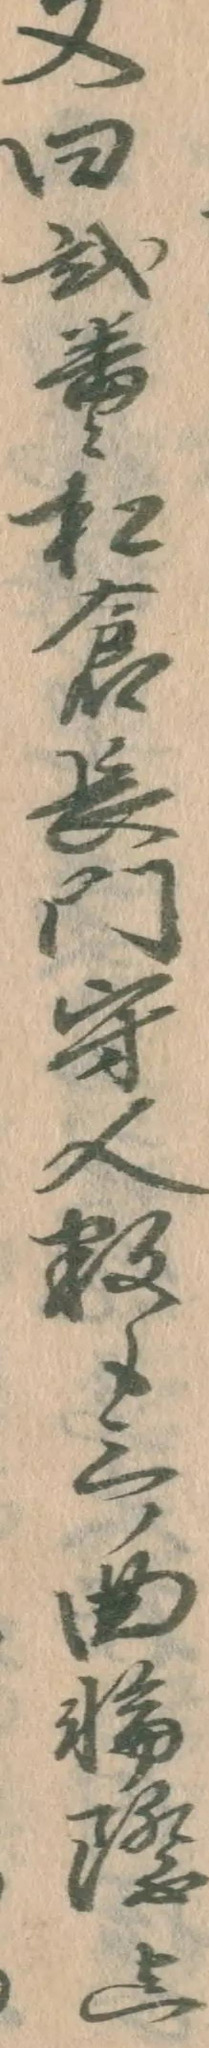又曰弐番に松倉長門守人数も三之曲輪際迄
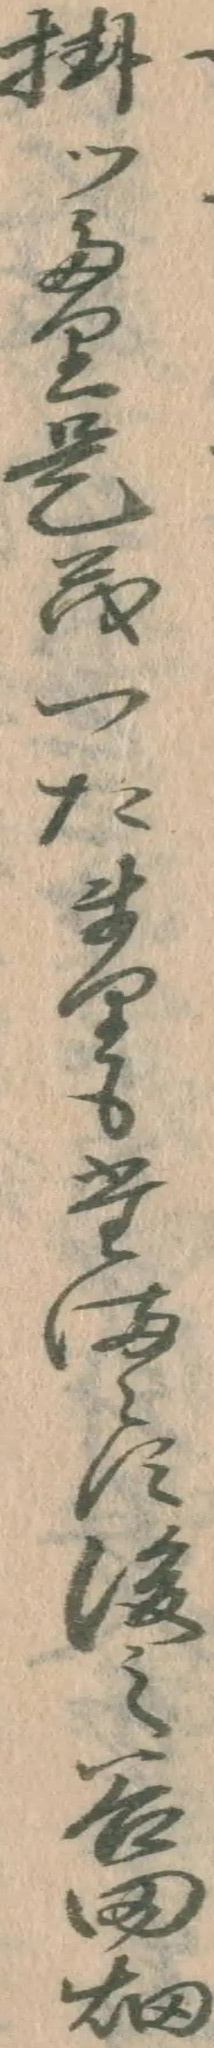掛つ多里是茂一たま里も堂満ら須後之谷田畑
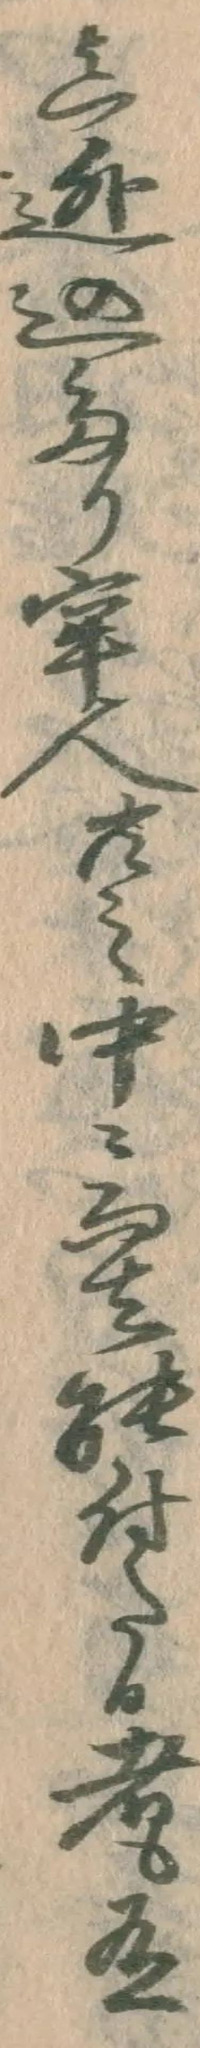迄逃込多り牢人共之中に而者能付たる者も有
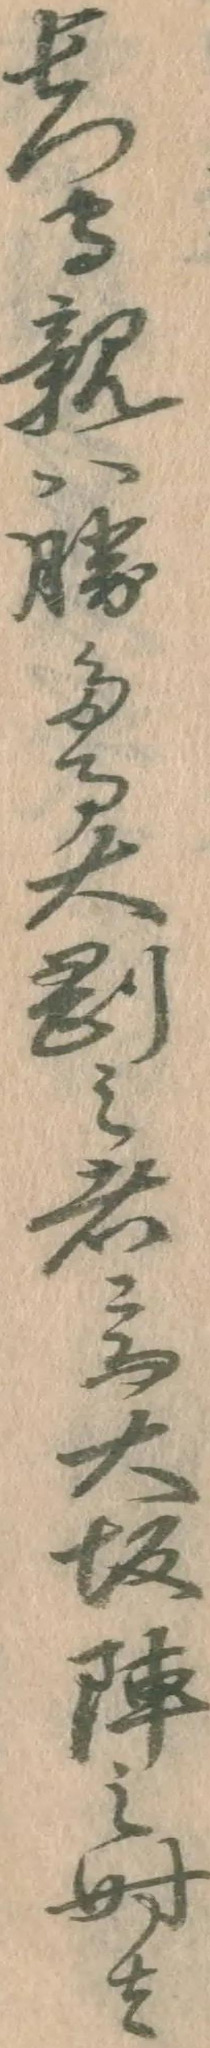長門守親は勝多る大別之者に而大坂陣之時者
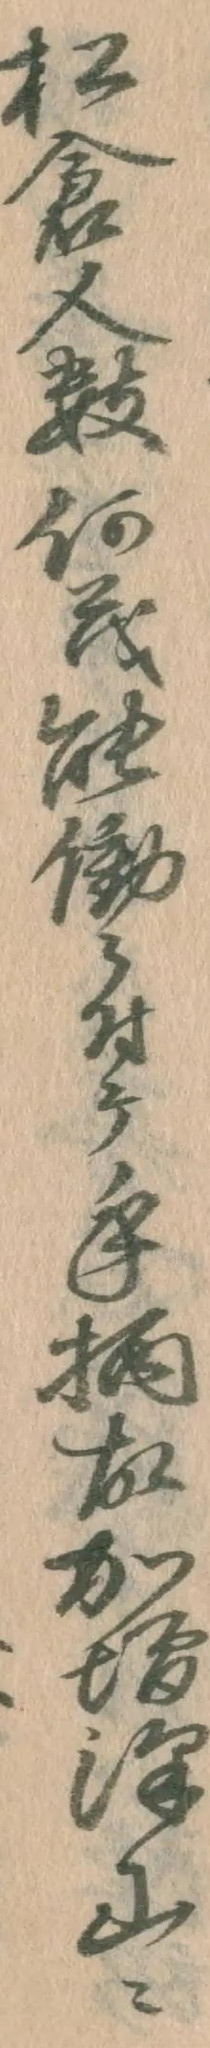松倉人数何茂能働に付て手柄故加増沢山に
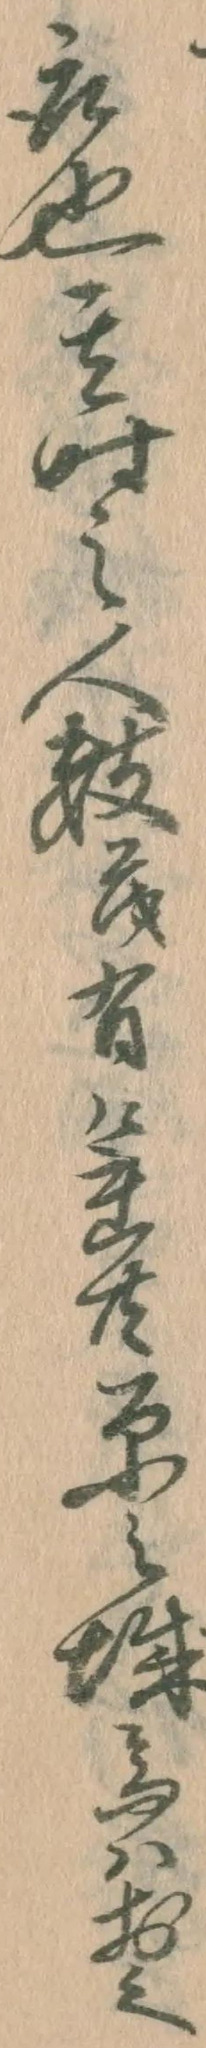取也其時之人数茂有け連共原之城に而はおく
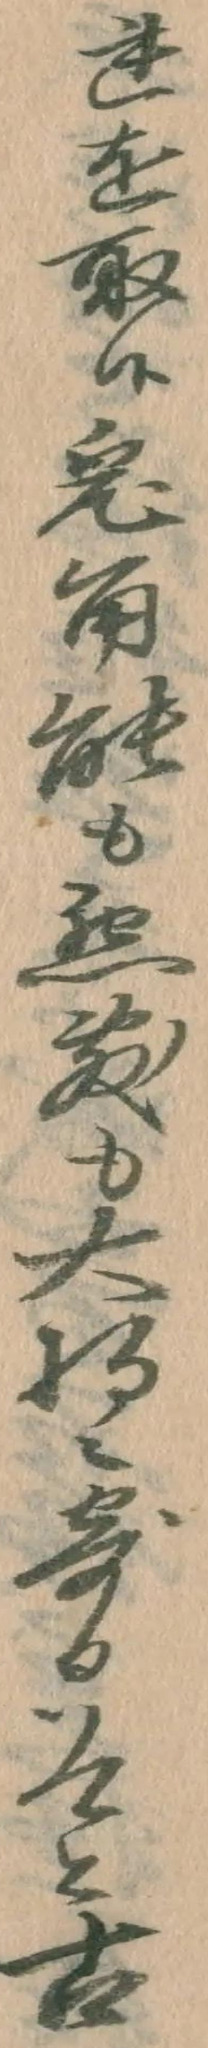連を取候兎角能も悪敷も大将に寄る上と古
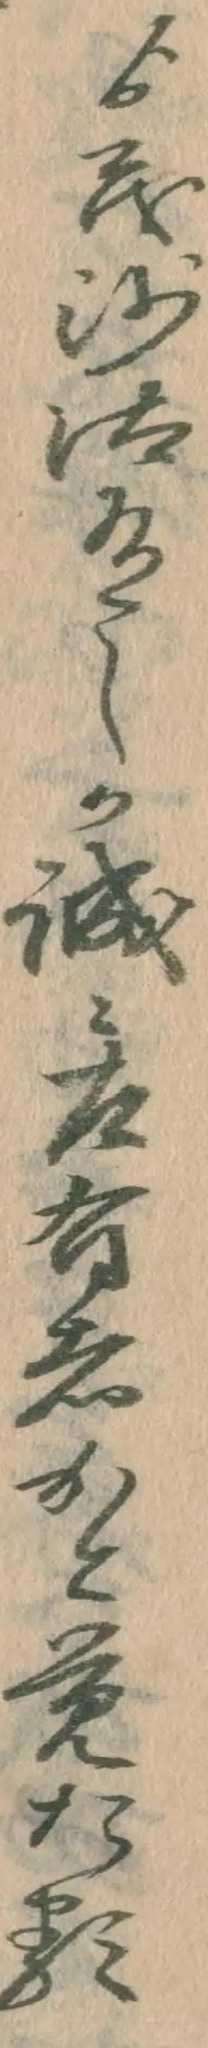ゟ茂沙汰有しか誠に左有者かと覚た類
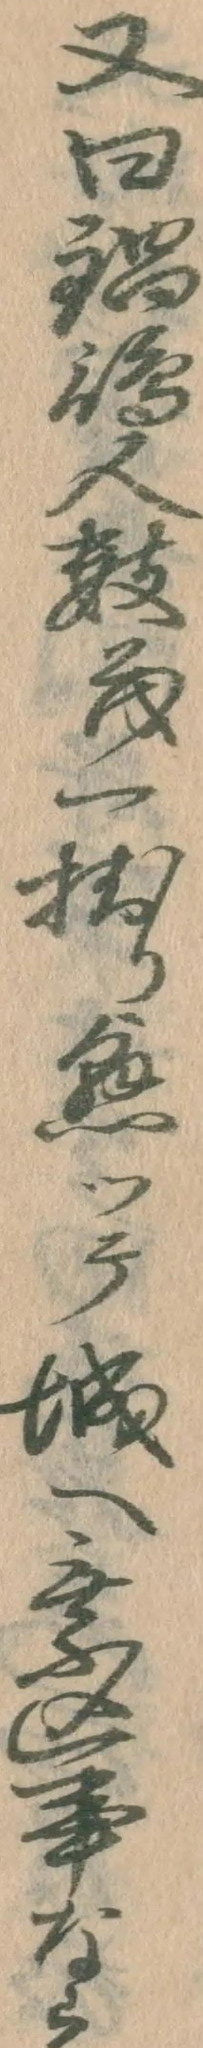又曰鍋島人数茂一掛り懸つて城へ乗込事なら
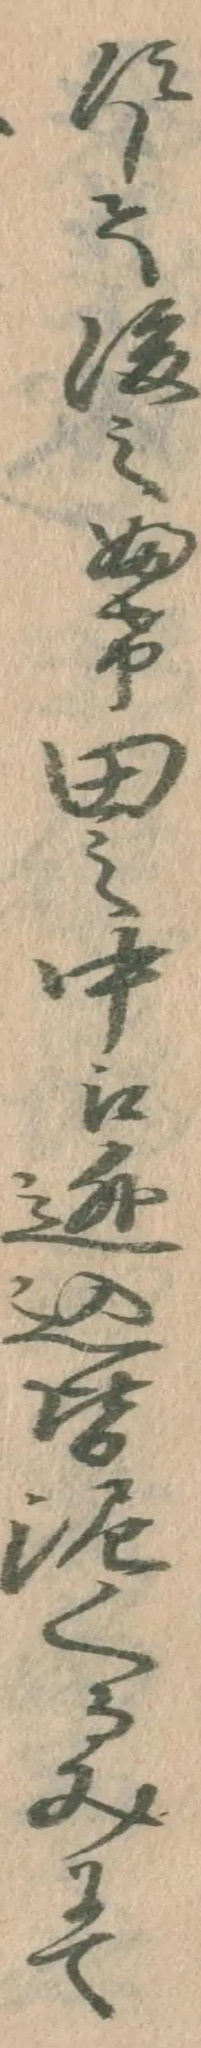須して後之婦希田之中江逃込皆泥くるみ尓て
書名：切支丹御退治記 49巻. [5]
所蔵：国立国会図書館 National Diet Library, JAPAN
